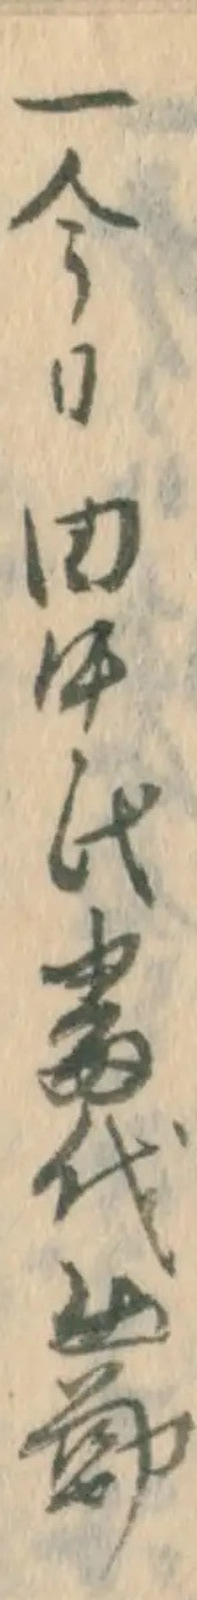一今日田中氏番代出勤

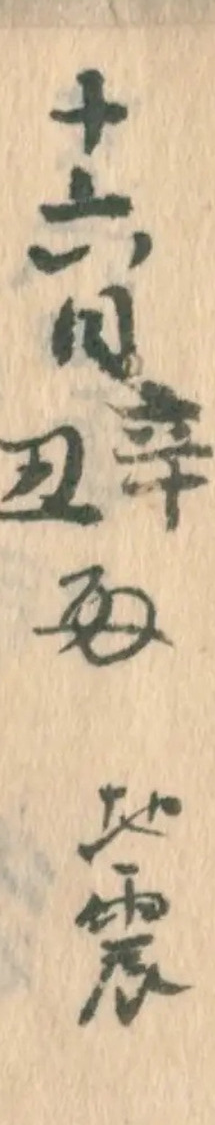十六日辛丑雨地震
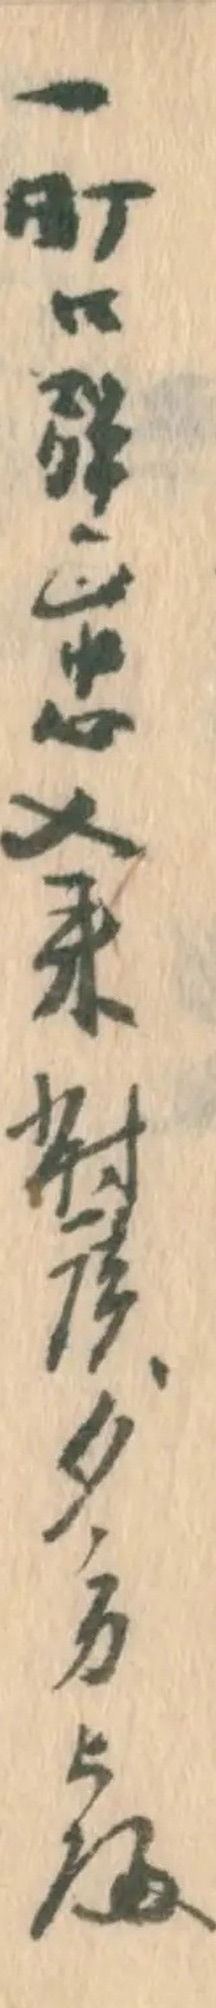一町口弾正忠入来対談夕方被帰
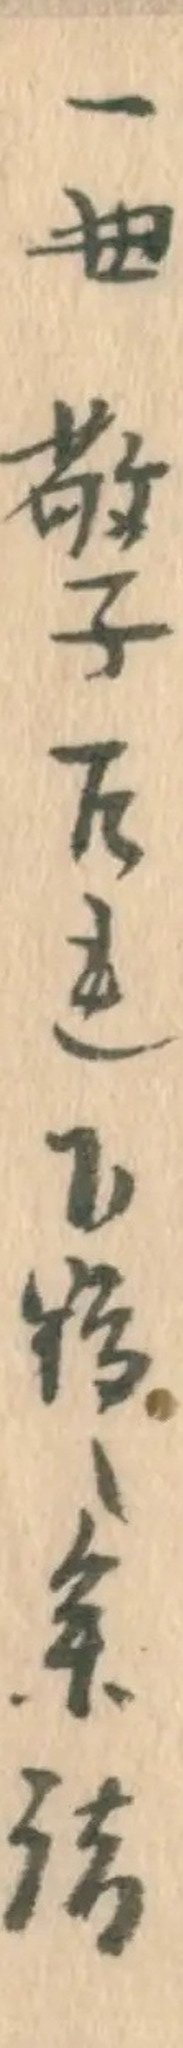一母敬子召連下鴨へ参詣
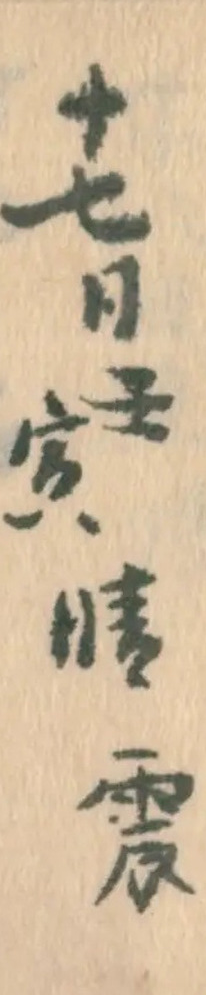十七日壬寅晴震
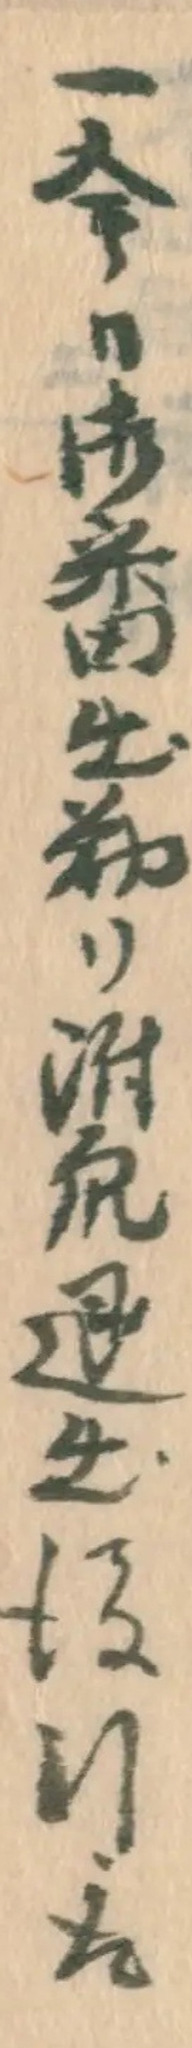一今日御番出勤御附衆退出後引取
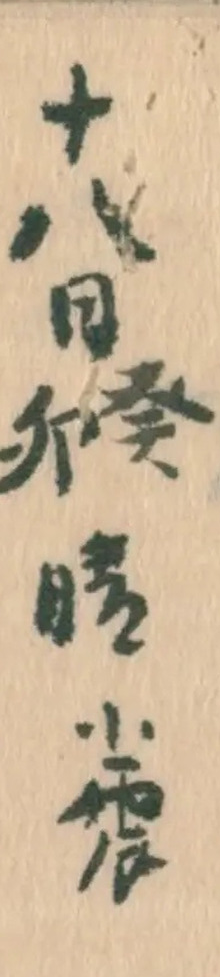十八日癸卯晴小震
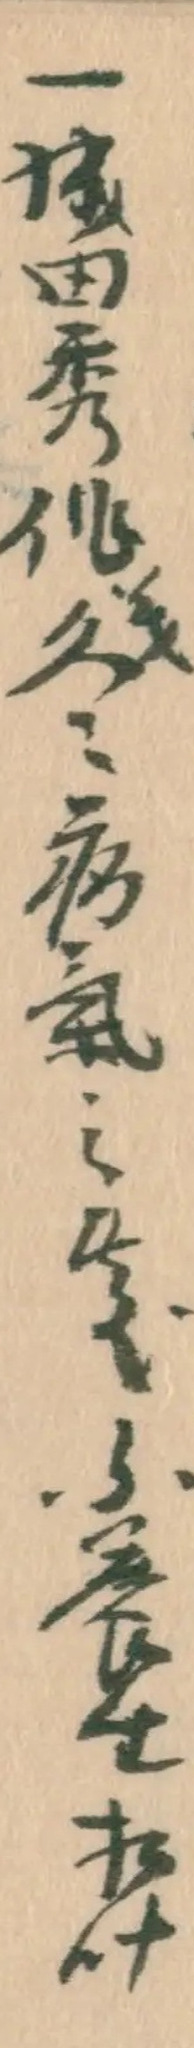一成田秀作義久々病気之処不養生相叶
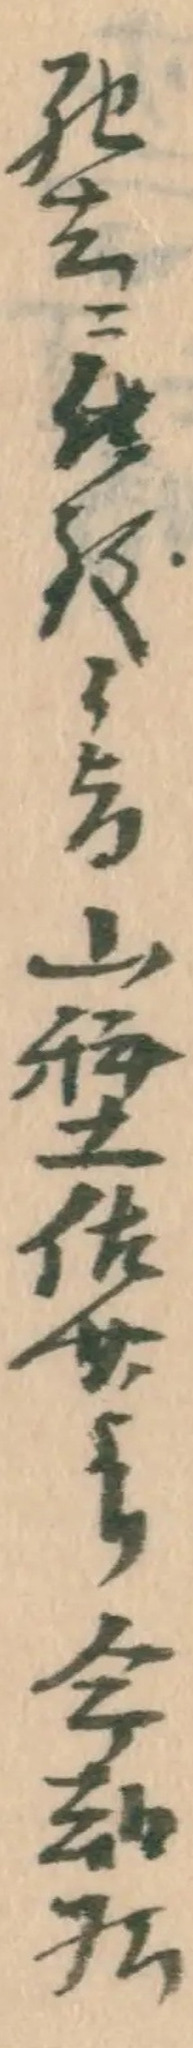死去ニ被致候旨山科土佐介より今朝為
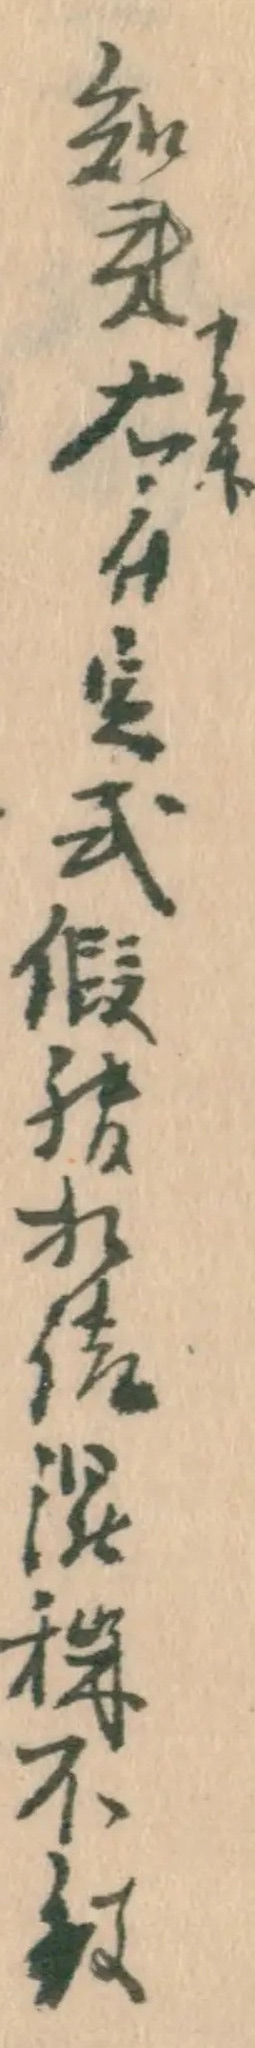知来申参右ニ付定式仮服相請混穢不致
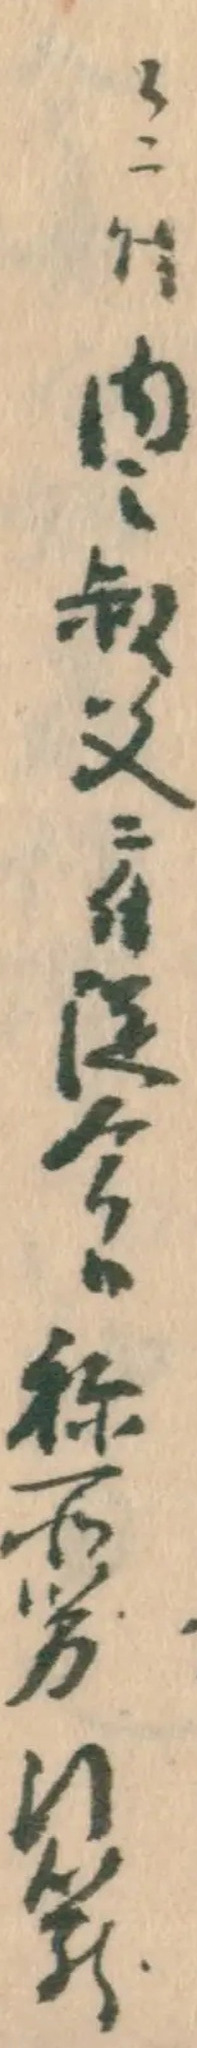候ニ付内々叔父ニ付従今日称所労引籠
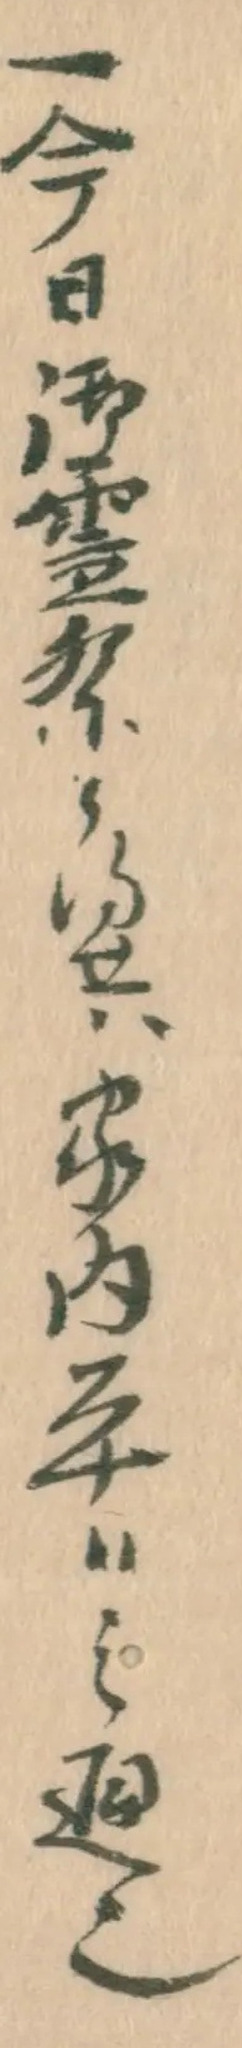一今日御霊祭候得共家内平日之通也
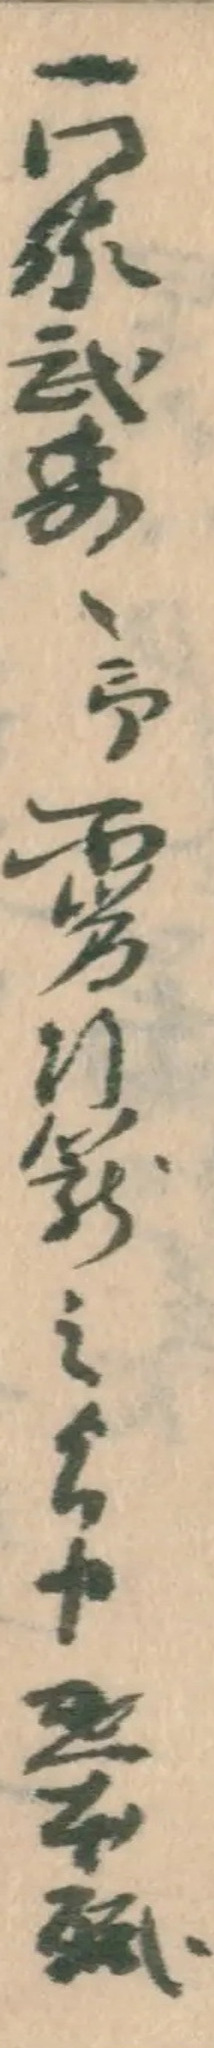一同家武寿へ予所労引籠之旨申遣本職
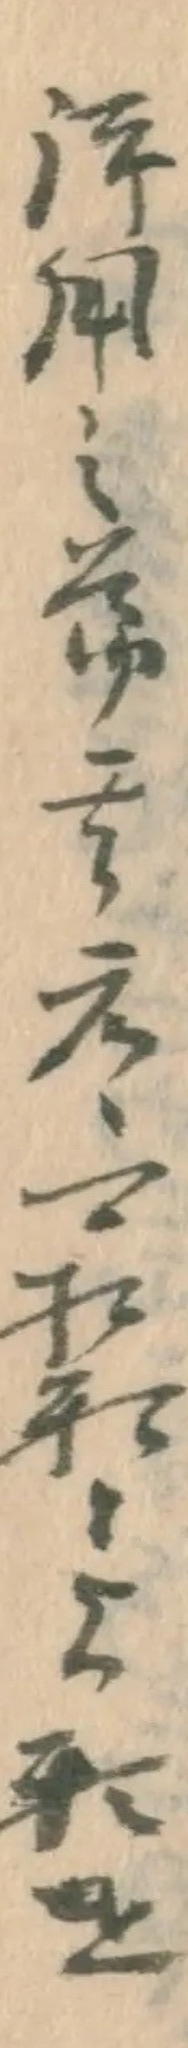評用之節其序可相頼之旨頼遣
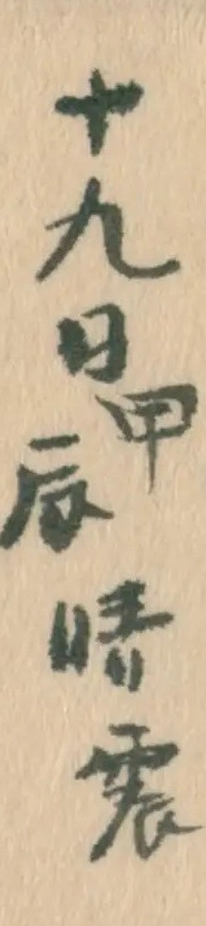十九日甲辰晴震
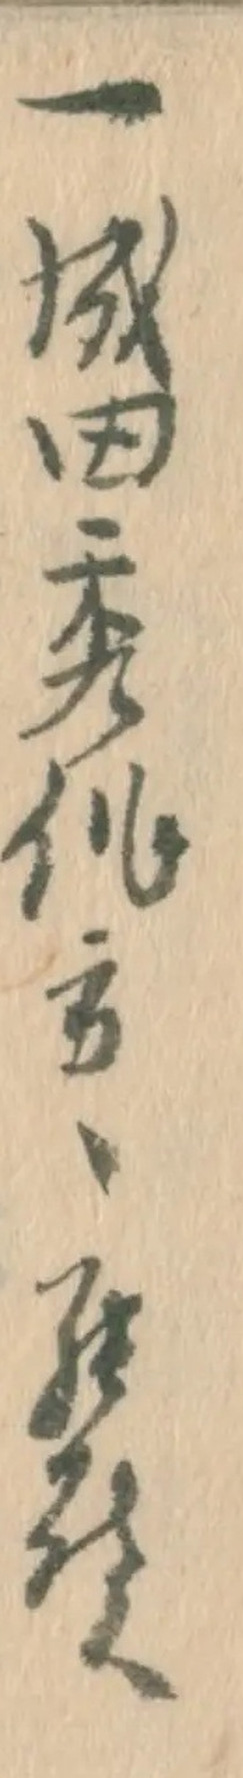一成田秀作方へ罷越ス
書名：禁裏御所御用日記. [131]
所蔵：国立国会図書館 National Diet Library, JAPAN
